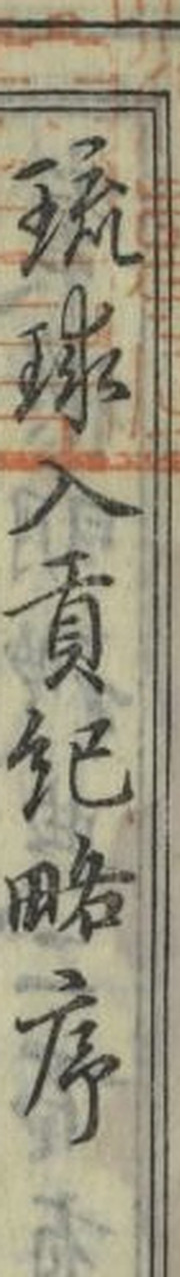琉球入貢紀略序
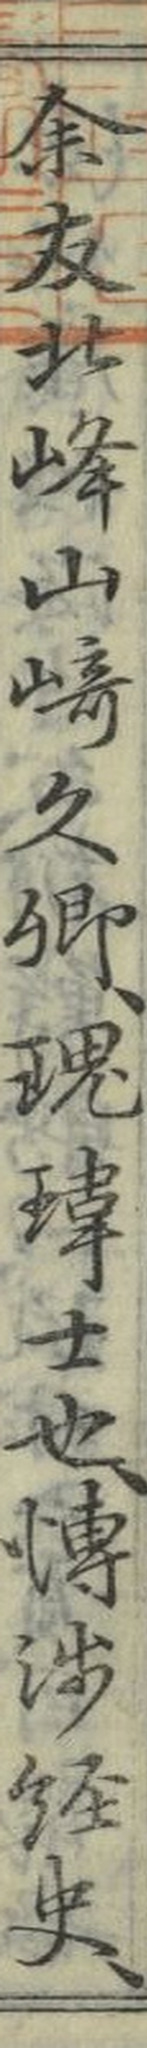余友北峰山崎久郷、瑰瑋士也、博渉経史、
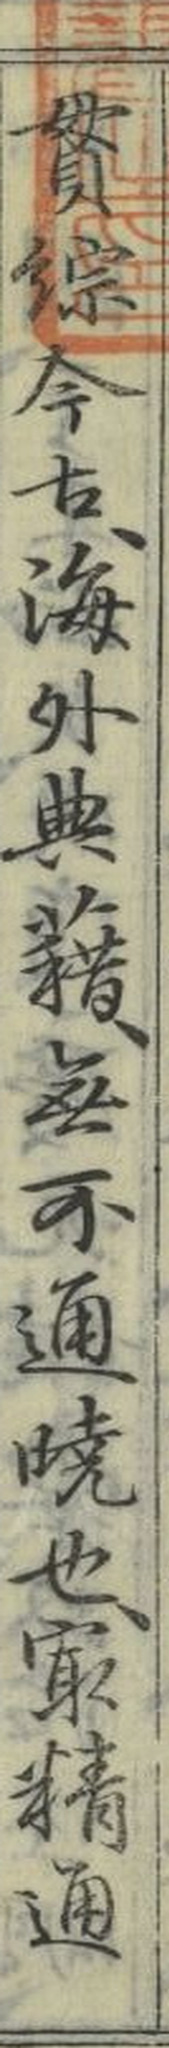貫綜今古、海外典籍、無不通暁也、最精通
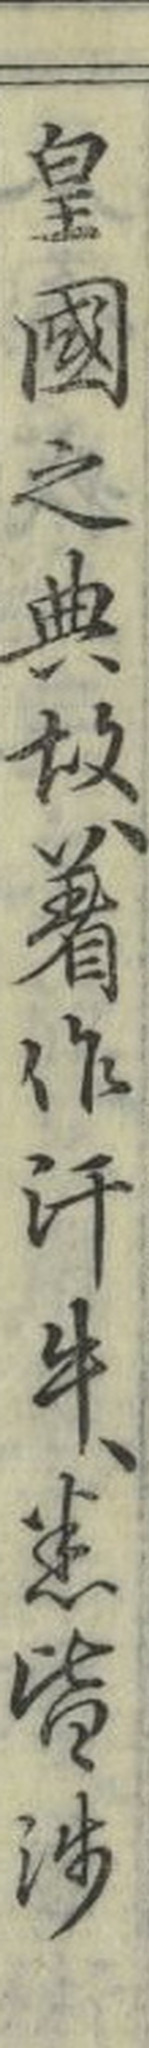皇国之典故、着作汗牛、悉皆渉
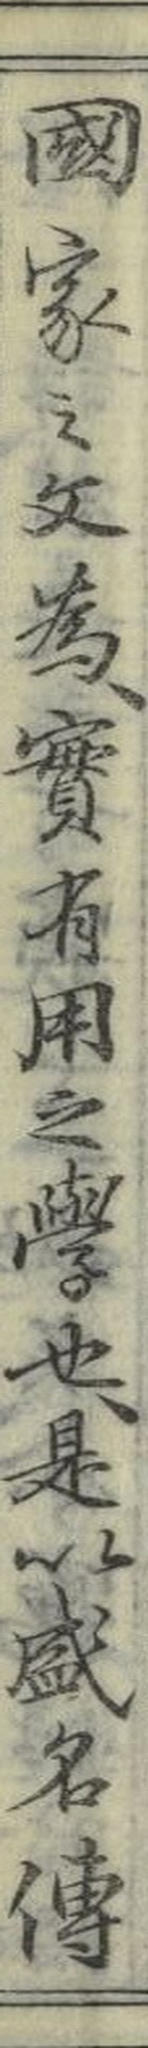国家之文為、実有用之学也、是以盛名伝
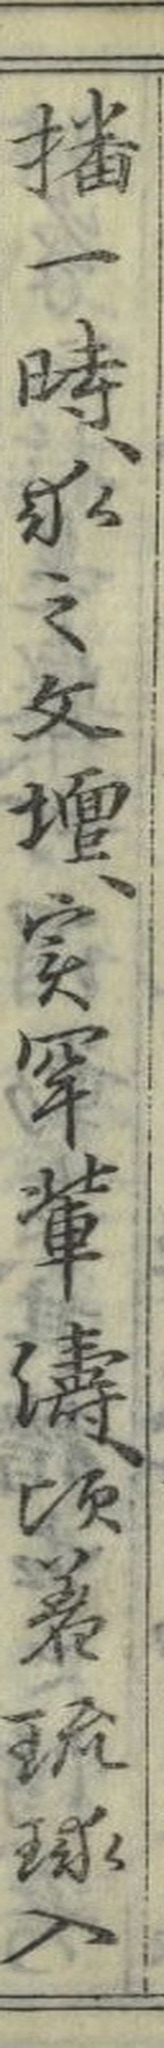播一時、求之文壇、実罕輩儔、頃着琉球入
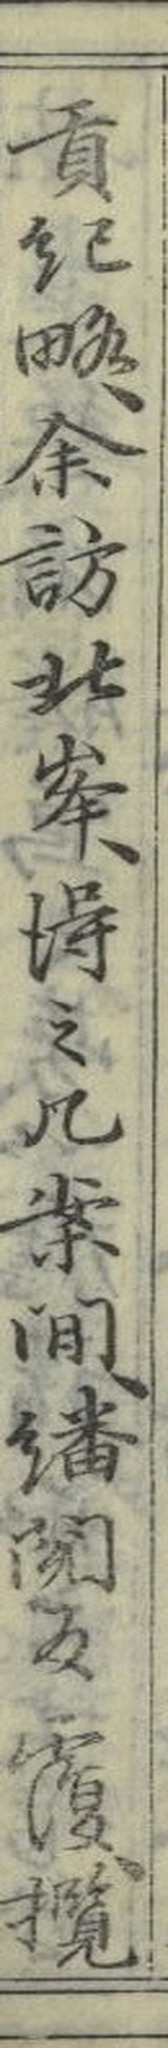貢紀略、余訪北峰、得之凡案間、繙閲反覆、攬
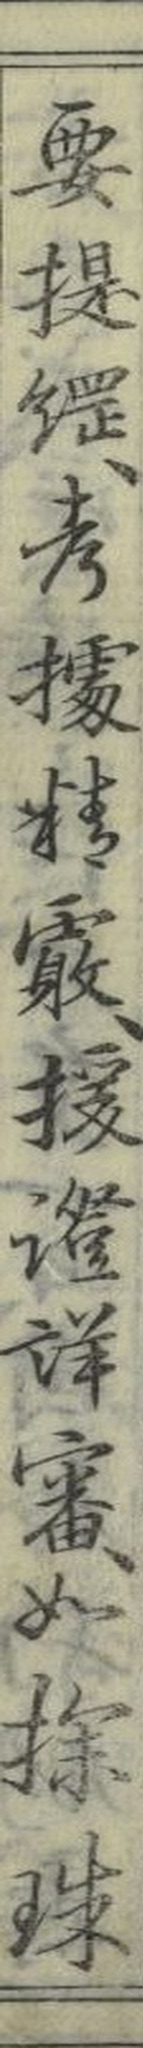要提綱、考拠精霰、援証詳審、如探珠
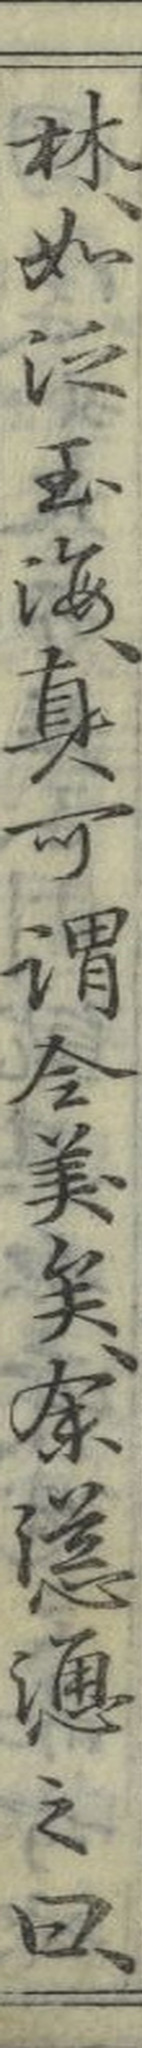林、如泛玉海、真可謂会美矣、余濨慂之曰、
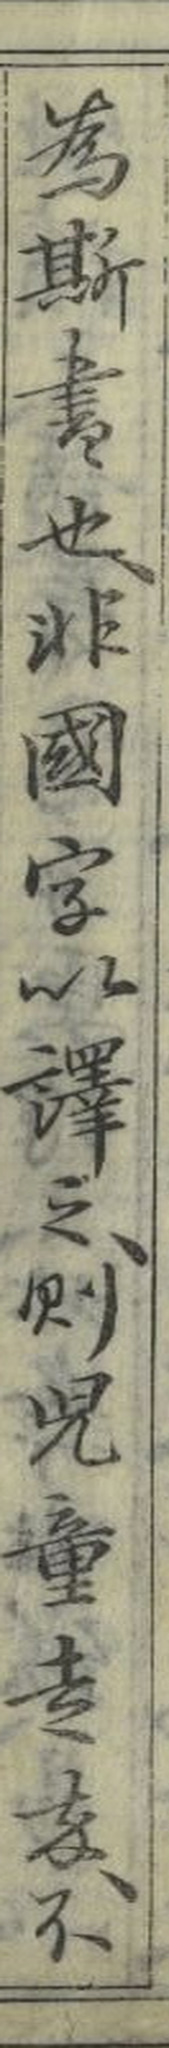為斯書也、非国字以訳之、則児童走卒、不

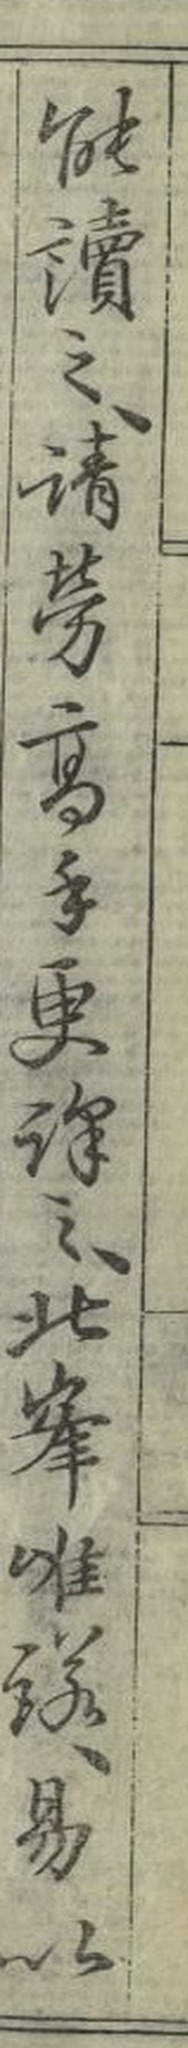能読之、請労高手更訳之、北峰唯諾、易以
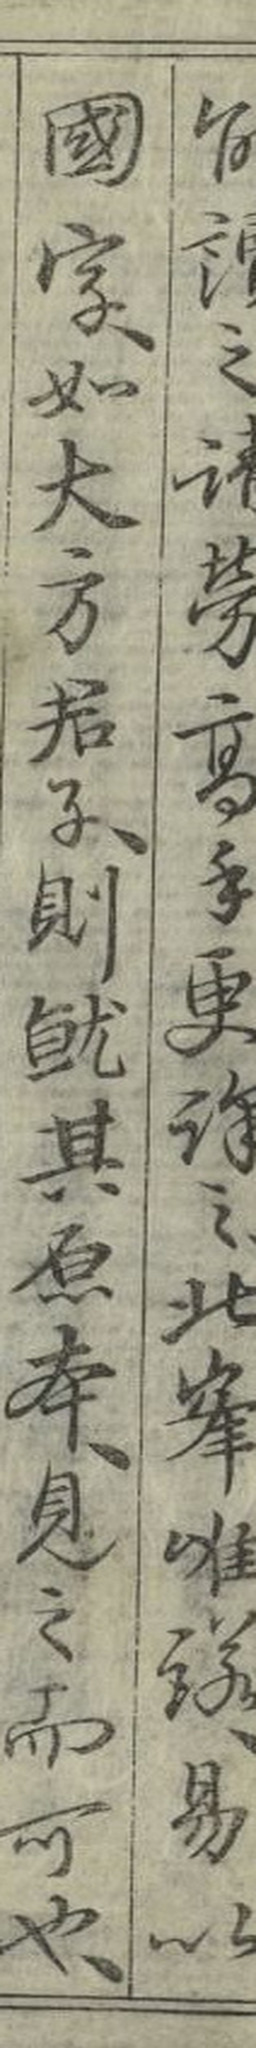国字、如大方君子、則就其原本、見之而可也、
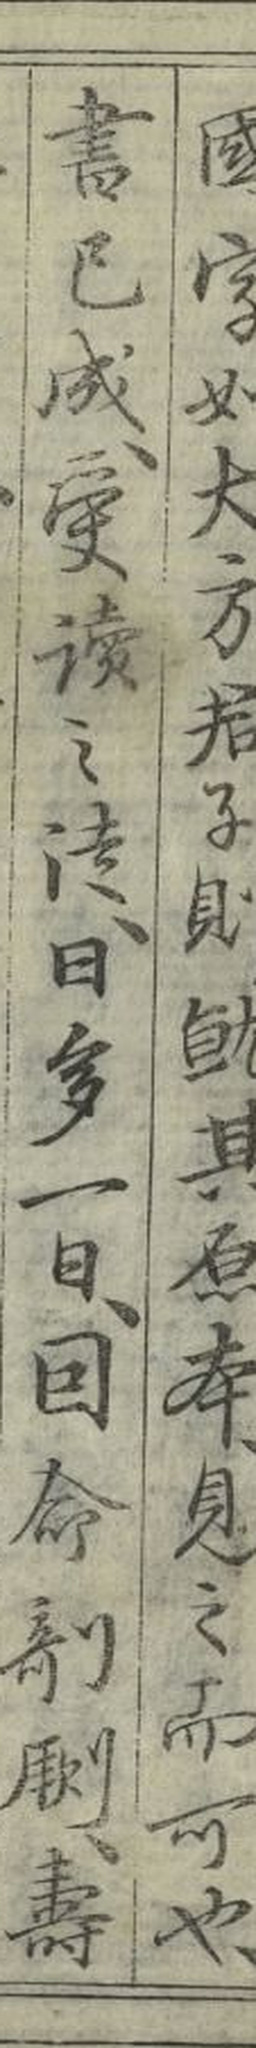書已成、受読之徒、日多一日、因命剞劂、寿
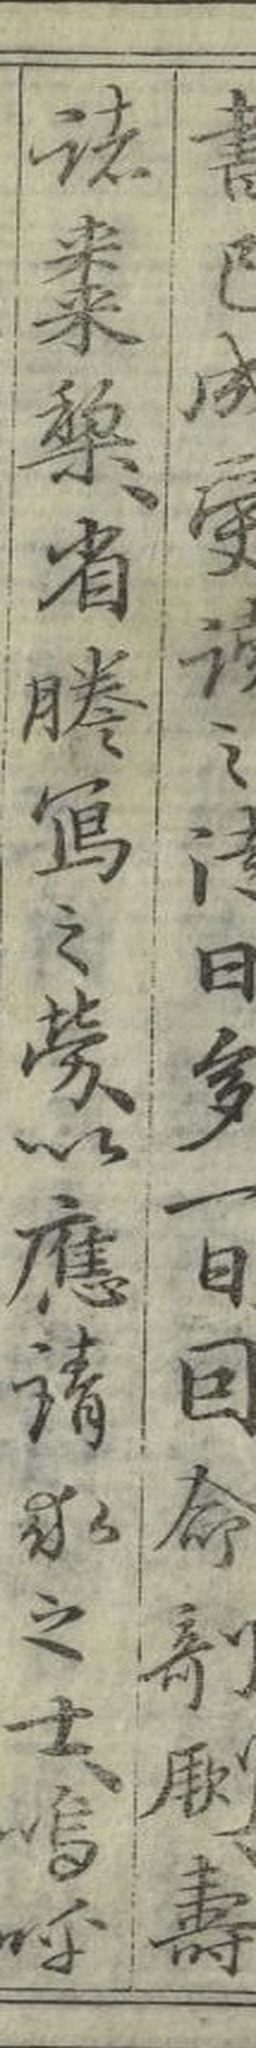諸梨、省謄写之労、以応請求之士、嗚呼
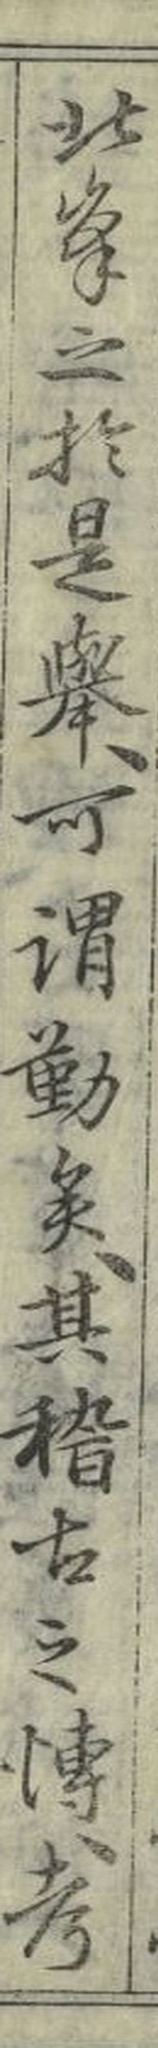北峰之於是挙、可謂勤矣、其稽古之博、考
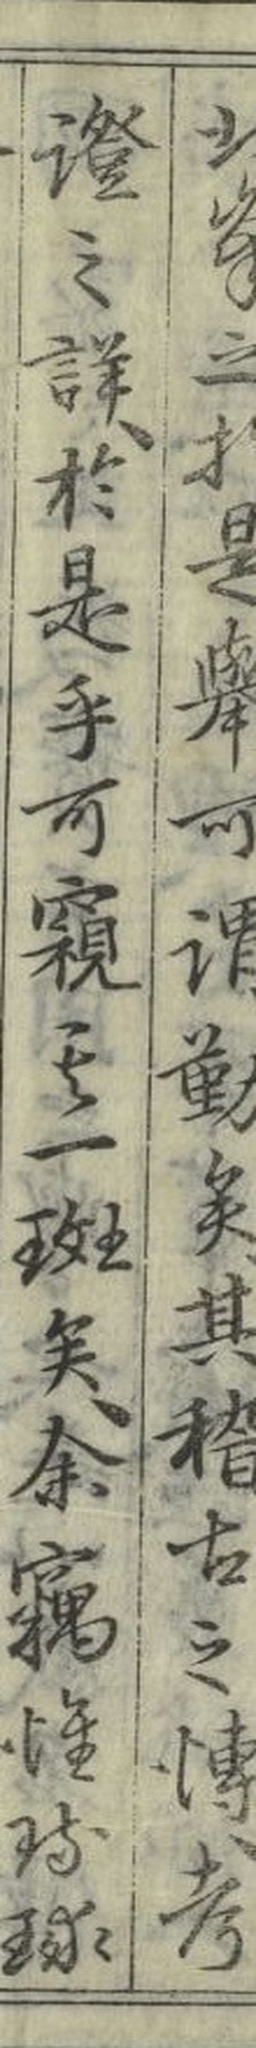証之詳、於是乎可窺其一斑矣、余竊雖琉球
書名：琉球入貢紀畧
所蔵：University of the Ryukyus Library
